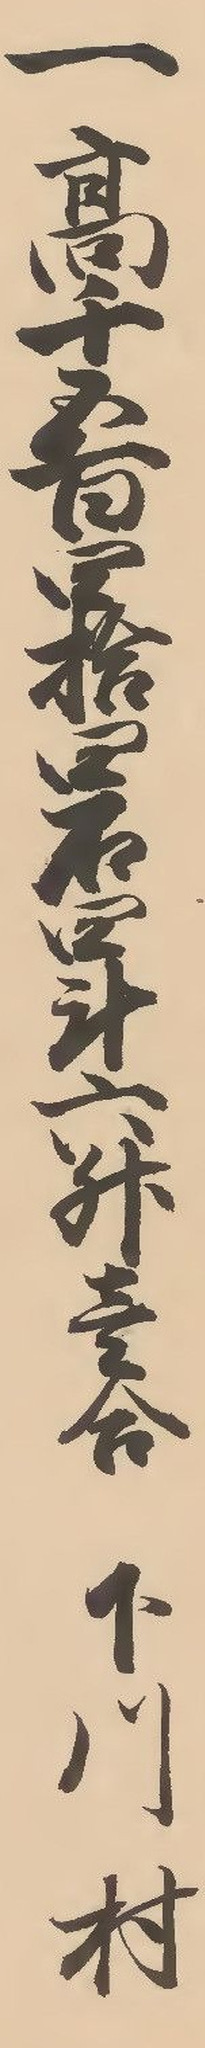一高千五百四拾四石四斗六升壱合下川村
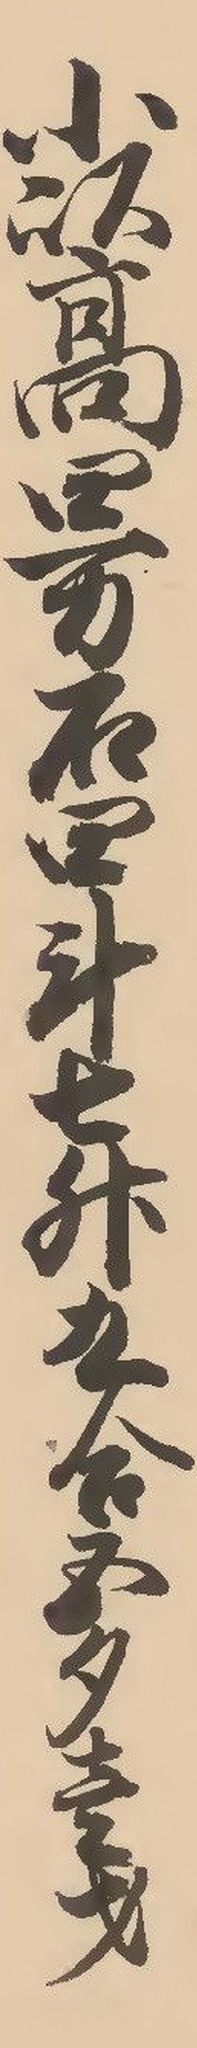小以四万石四斗四斗七升五合五勺壱才
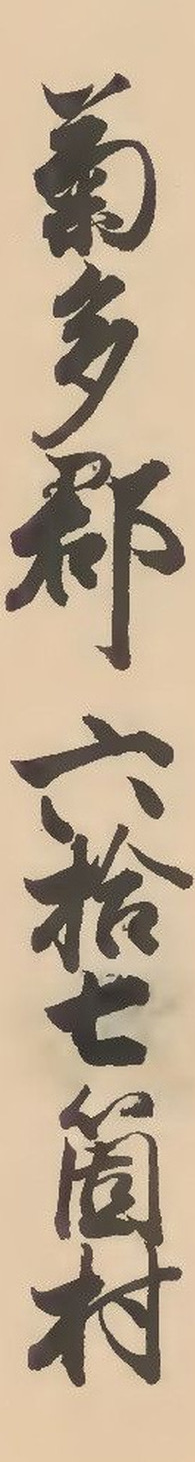菊多郡六拾七箇村
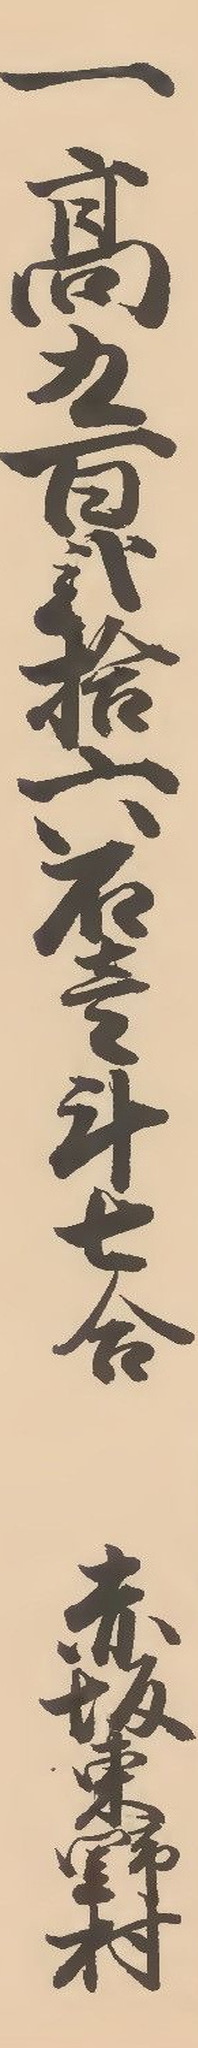一高九百弐拾六石壱斗七合赤坂東野村
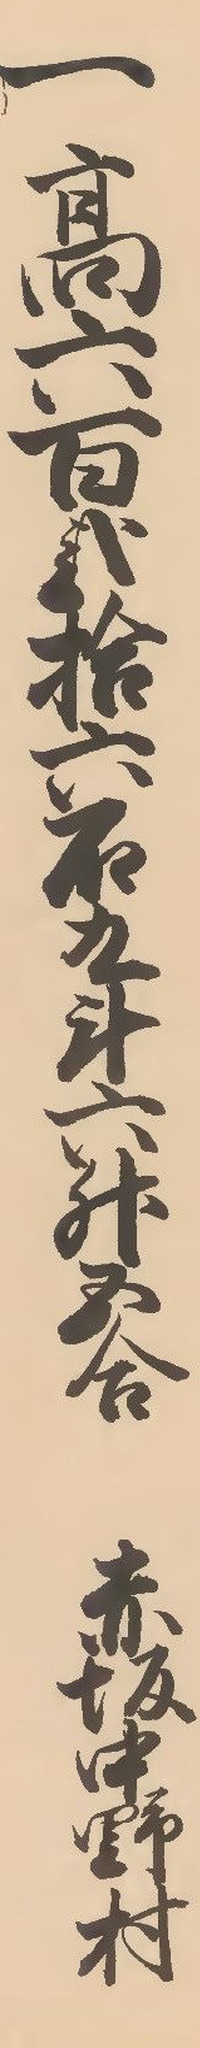一高六百弐拾六石九斗六升五合赤坂中野村

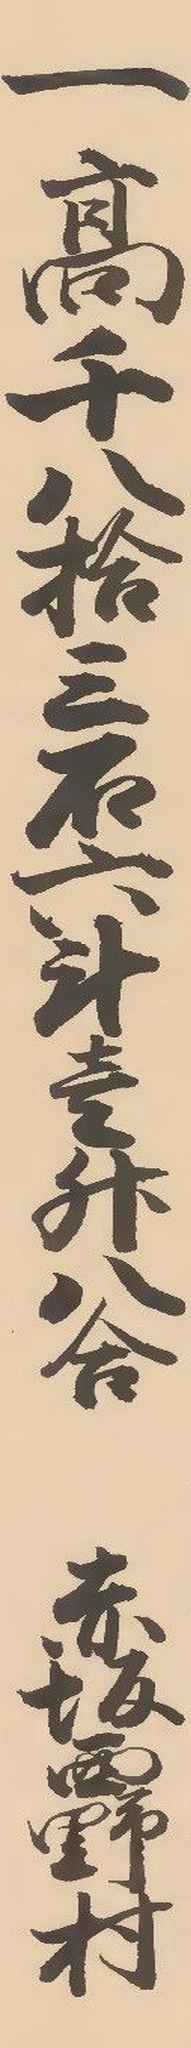一高千八拾三石六斗壱升八合赤坂西野村
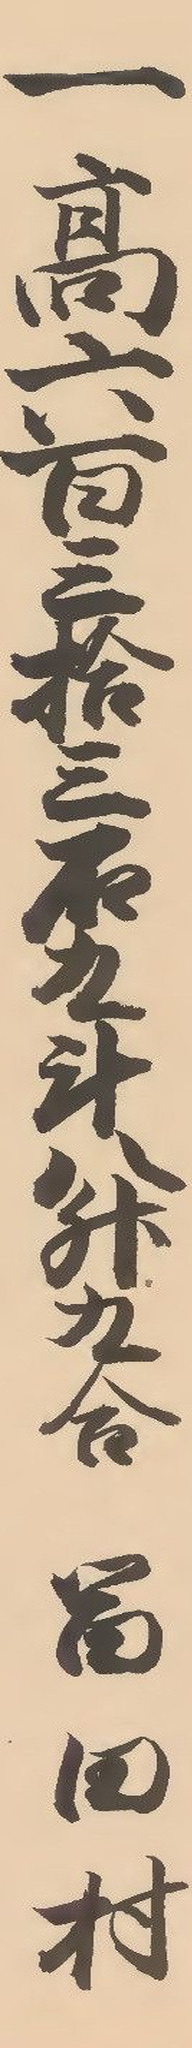一高六百三拾三石九斗八升九合富田村
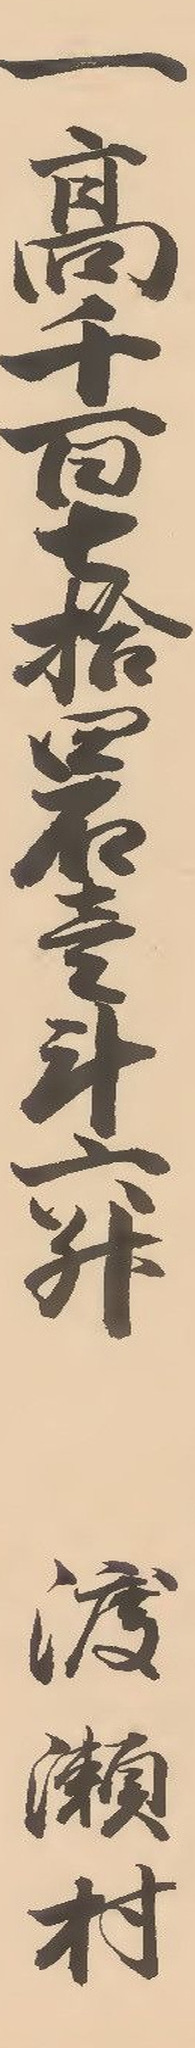一高千百七拾四石壱斗六升渡瀬村
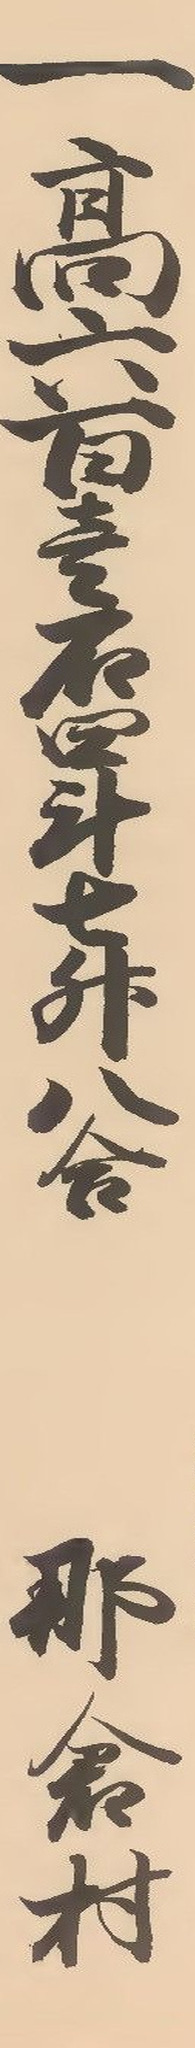一高六百壱石四斗七升八合那倉村
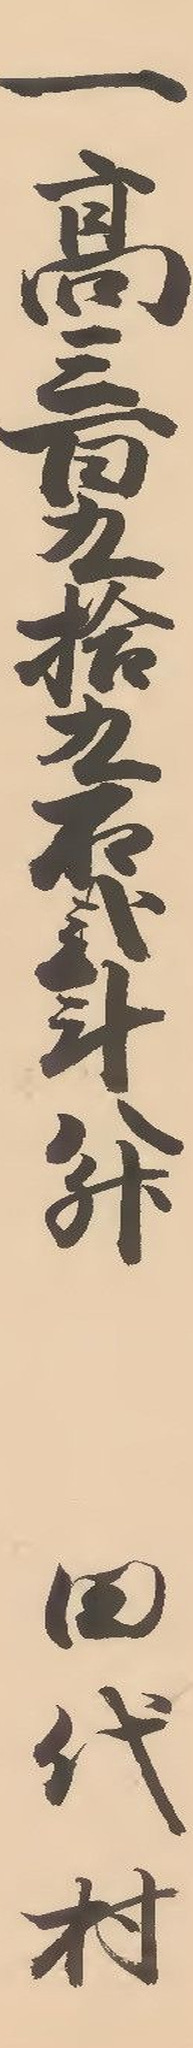一高三百九拾九石弐斗八升田代村
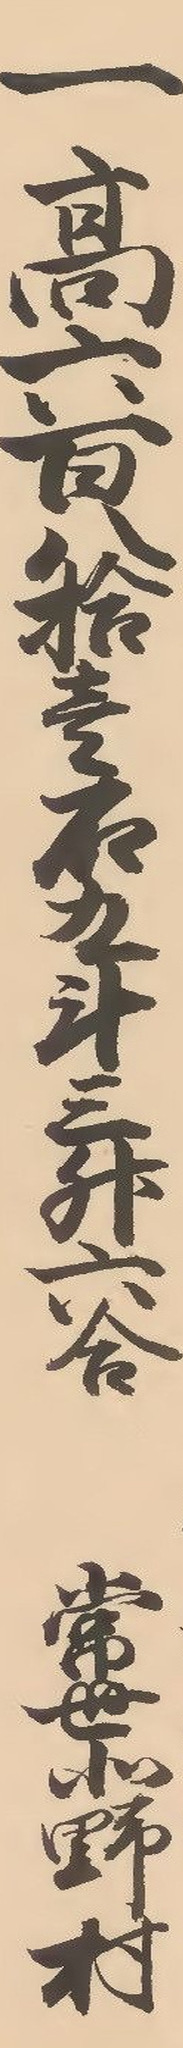一高六百八拾壱石九斗三升六合常世北野村
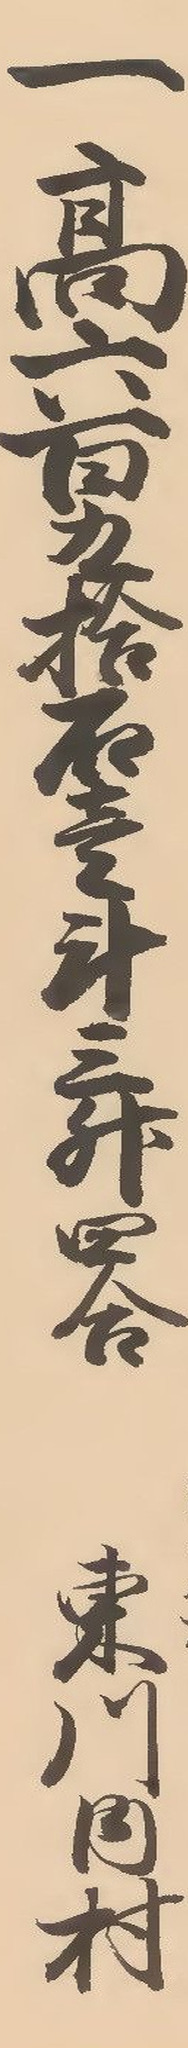一高六百九拾石壱斗三升四合東川内村

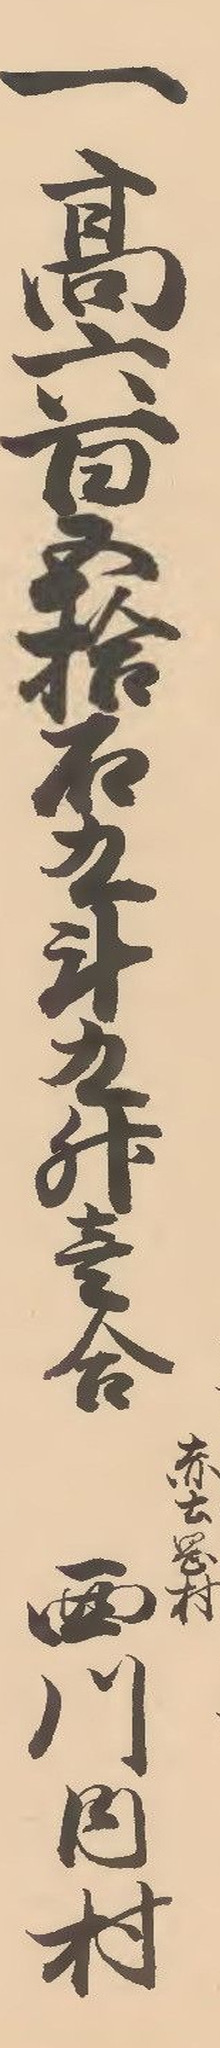一高六百五拾石九斗九升壱合西川内村
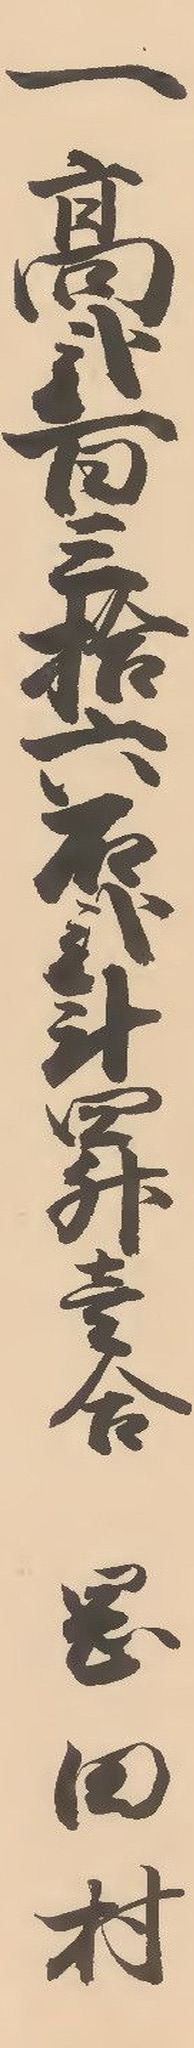一高弐百三拾六石弐斗四升壱合岡田村
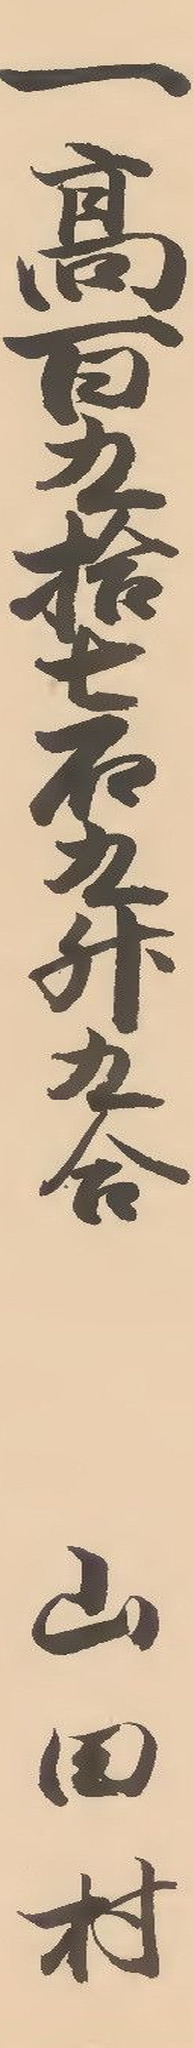一高百九拾七石九升九合山田村
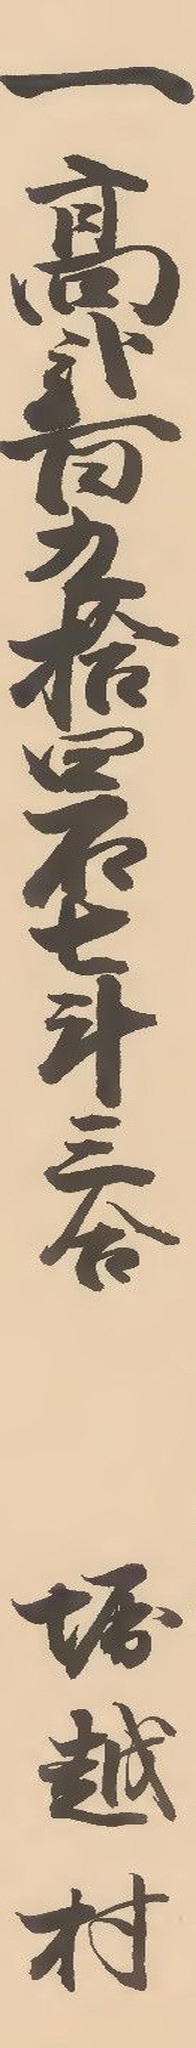一高弐百九拾四石七斗三合堀越村
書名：陸奥国郷帳　３
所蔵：国立公文書館 National Archives of Japan
